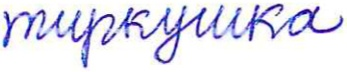тиркушка
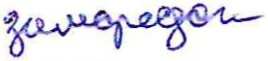зимородок
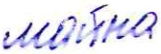майна
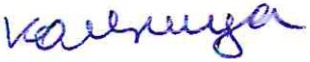калпица
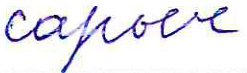сарыч
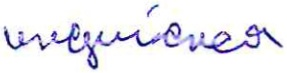индийская
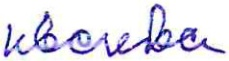кваква
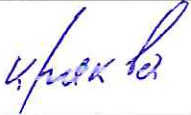кряква
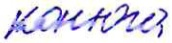конюга
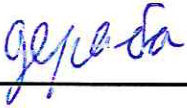деряба
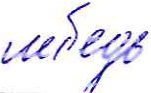лебедь
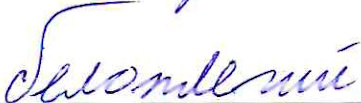белоплечий
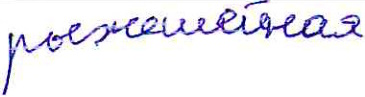рыжешейная
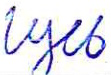гусь
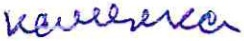камелка
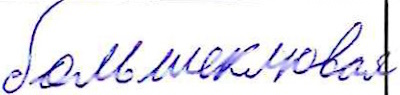большеклювая
